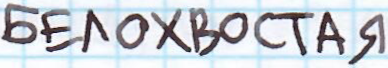белохвостая
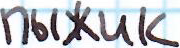пыжик
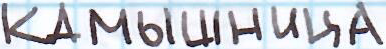камышница
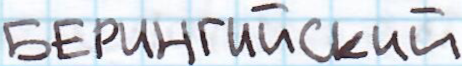берингийский
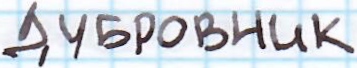дубровник
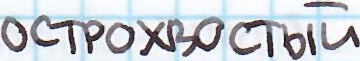острохвостый
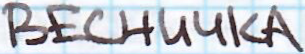весничка
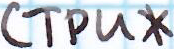стриж
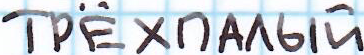трёхпалый
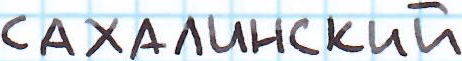сахалинский
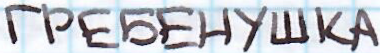гребенушка
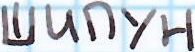шипун
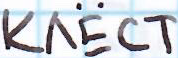клёст
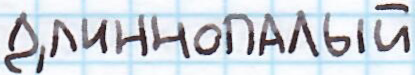длиннопалый
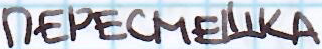пересмешка
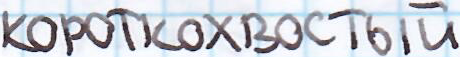короткохвостый
